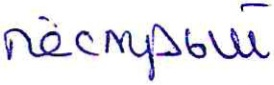пёстрый
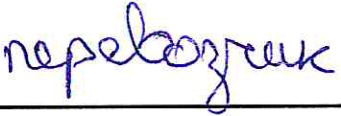перевозчик
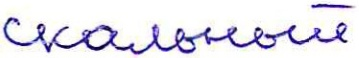скальный
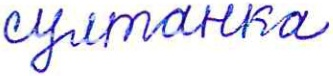султанка
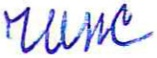чиж
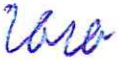гага
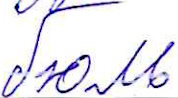бюль
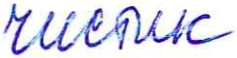чистик
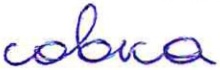совка
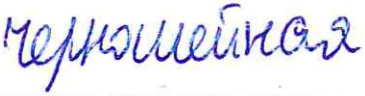черношейная
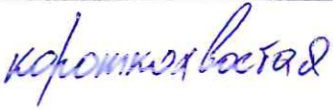короткохвостая
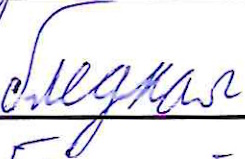бледная
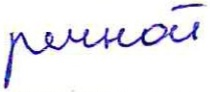речной
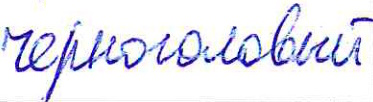черноголовый
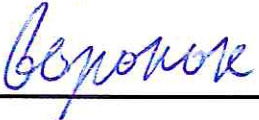воронок
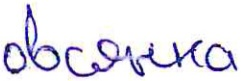овсянка
